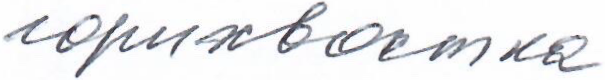горихвостка
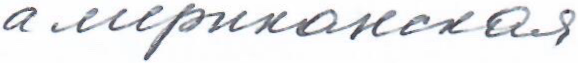а мериканская
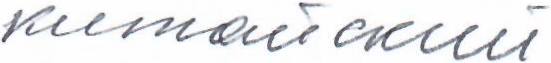китайский
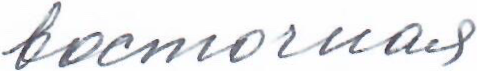восточная
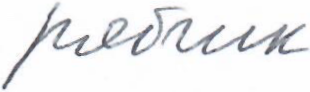рябчик
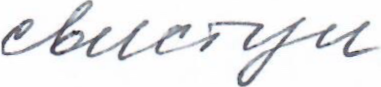свистун
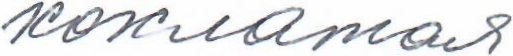хохлатая
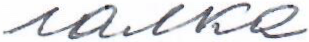галка
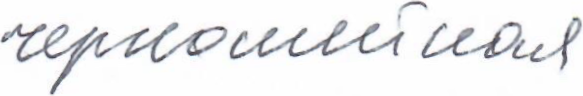черношейная
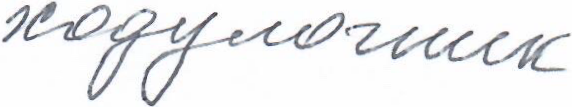ходулочник
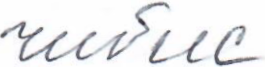чибис
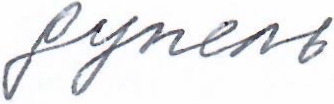дупель
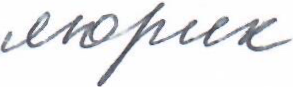люрик
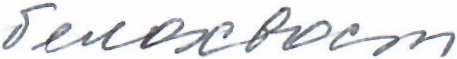белохвост
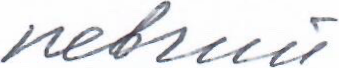певчий
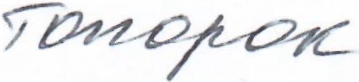топорок
